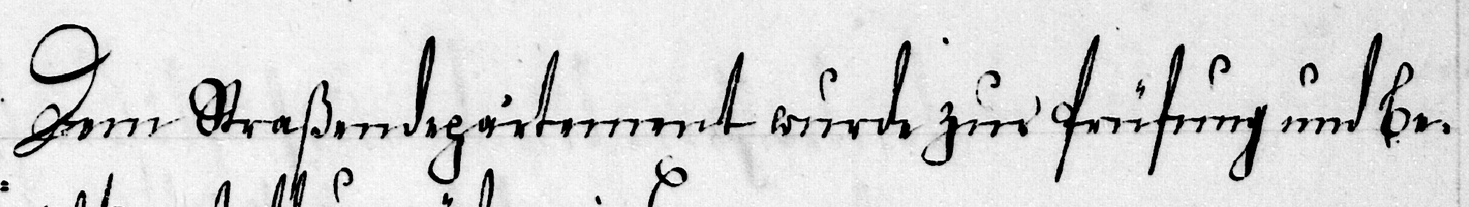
Dem Straßendepartement wurde zur Prüfung und Be¬
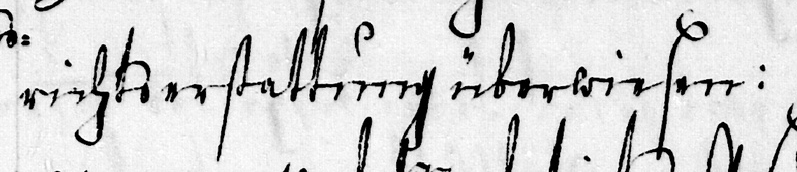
richtserstattung überwiesen:
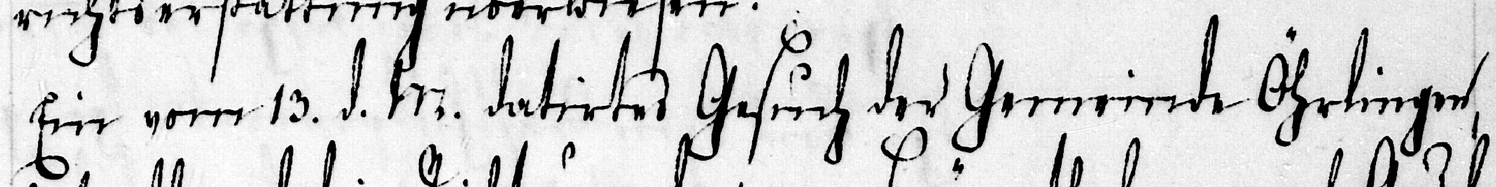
Ein vom 13. d. M. datirtes Gesuch der Gemeinde Öhrlingen
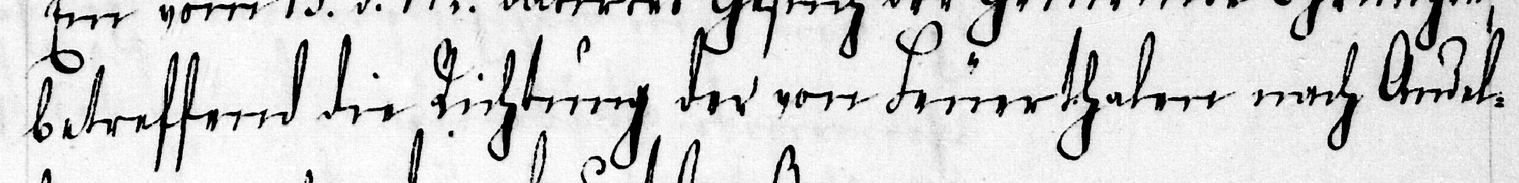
betreffend die Richtung der von Feuerthalen nach Andel¬
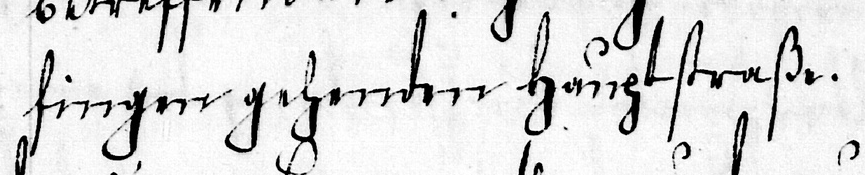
fingen gehenden Hauptstraße.
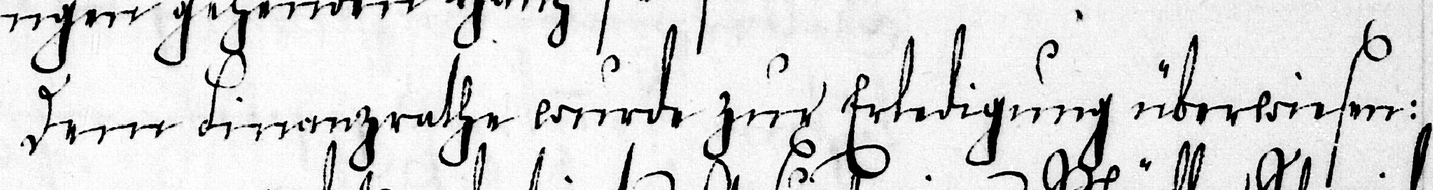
Dem Finanzrathe wurde zur Erledigung überwiesen:
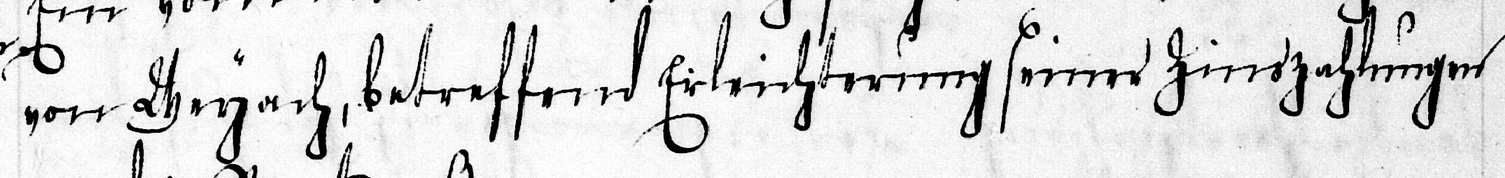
von Weyach, betreffend Erleichterung seiner Zinszahlungen
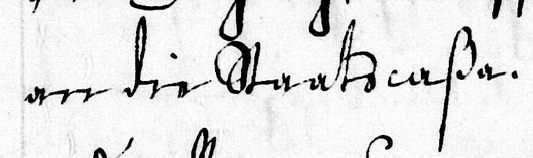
an die Staatscaßa.
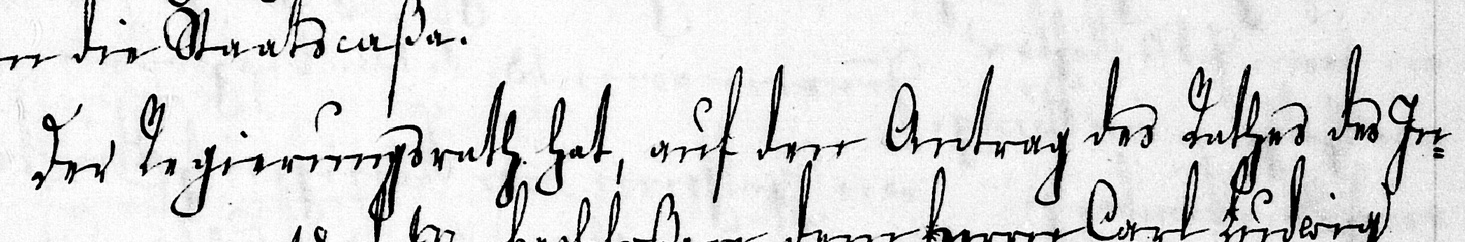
Der Regierungsrath hat, auf den Antrag des Rathes des I¬
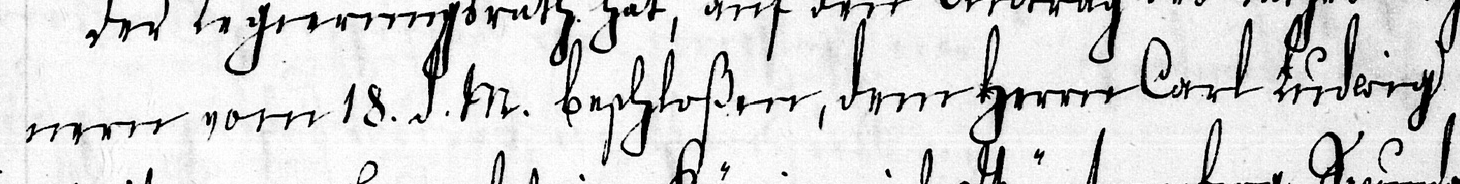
nnern vom 18. d. M. beschloßen, dem Herrn Carl Ludwig
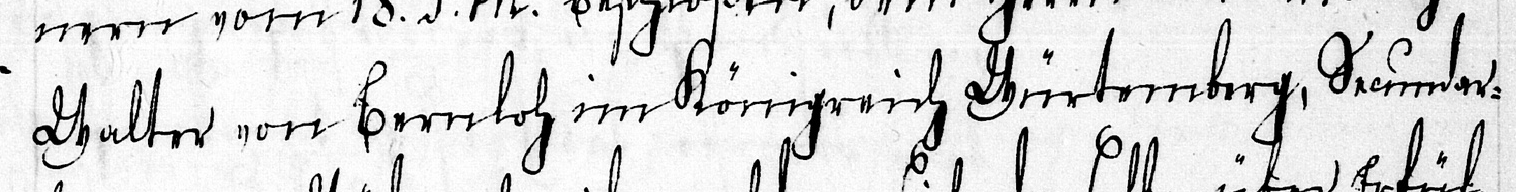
Walter von Bernloh im Königreich Würtemberg, Secundar¬
